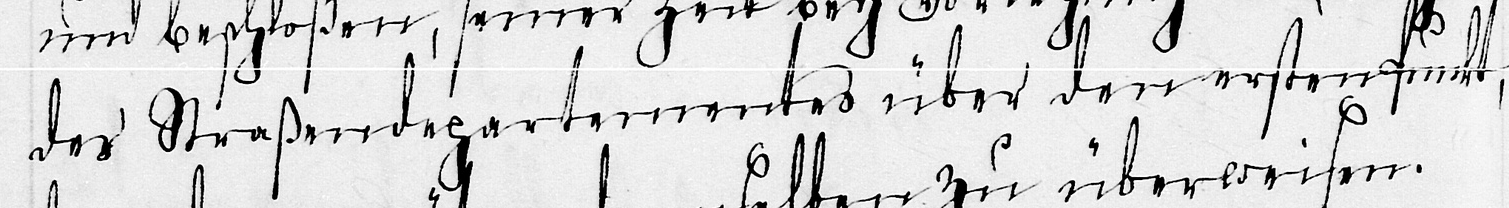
des Straßendepartementes über den ersten Punkt,
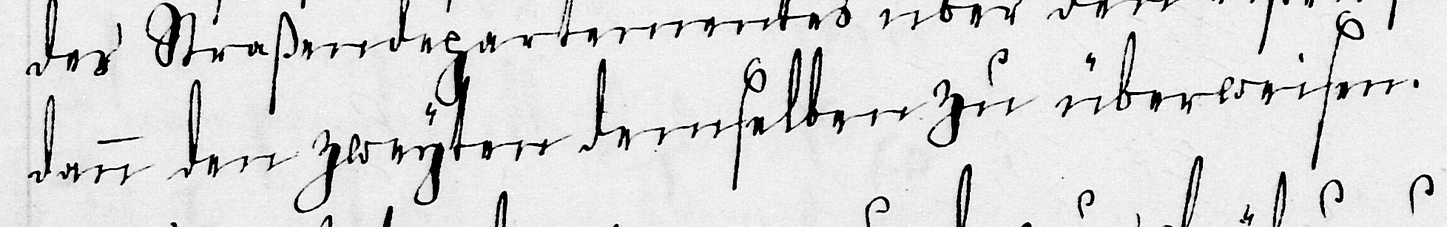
dann den zweyten demselben zu überweisen.
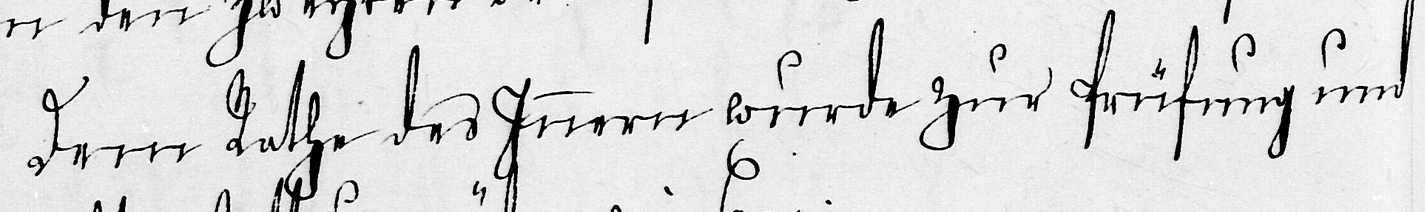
Dem Rathe des Innern wurde zur Prüfung und
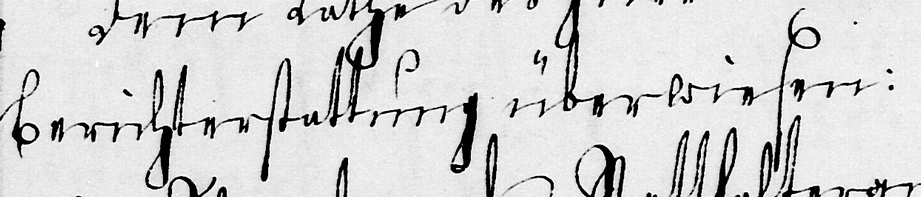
Berichterstattung überwiesen:
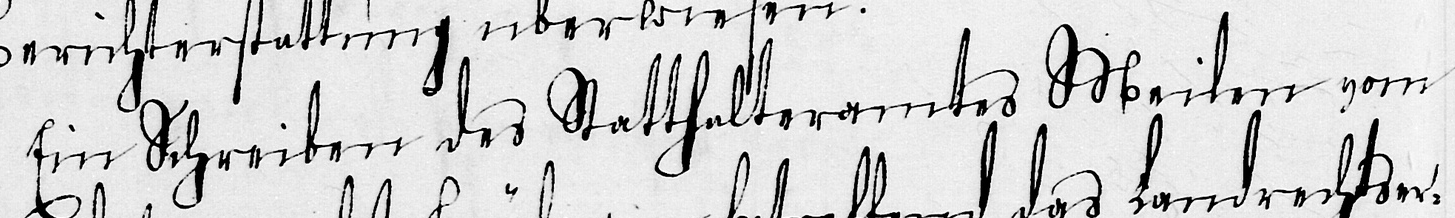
Ein Schreiben des Statthalteramtes Meilen vom
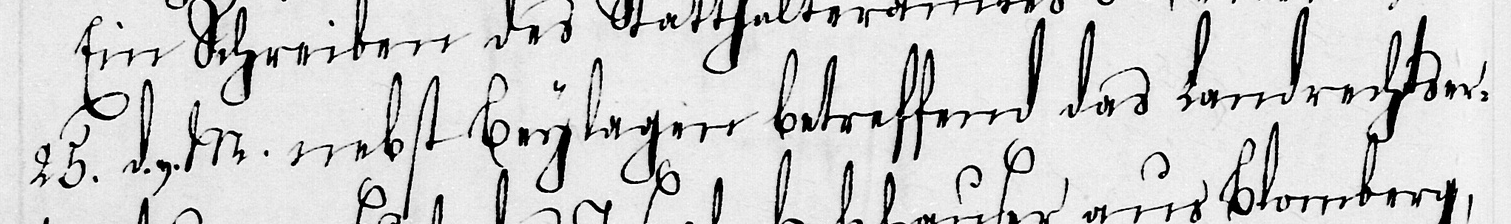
d. v. M. nebst Beylagen betreffend das Landrechtser¬
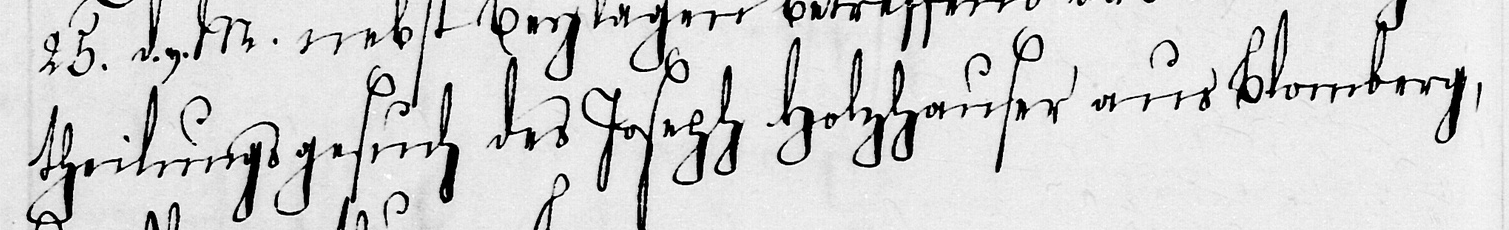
theilungsgesuch des Joseph Holzhauser aus Blomberg,
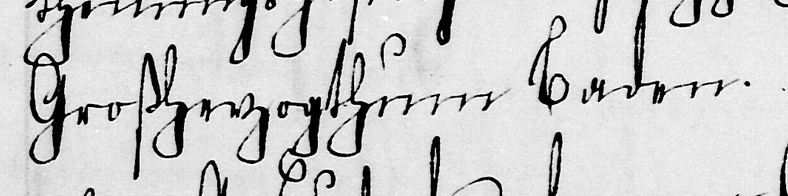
Großherzogthum Baden.
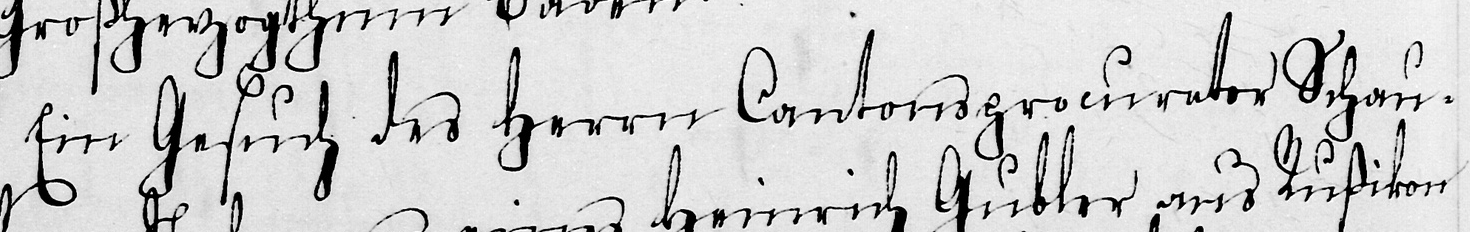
Ein Gesuch des Herrn Cantonsprocurator Schau¬
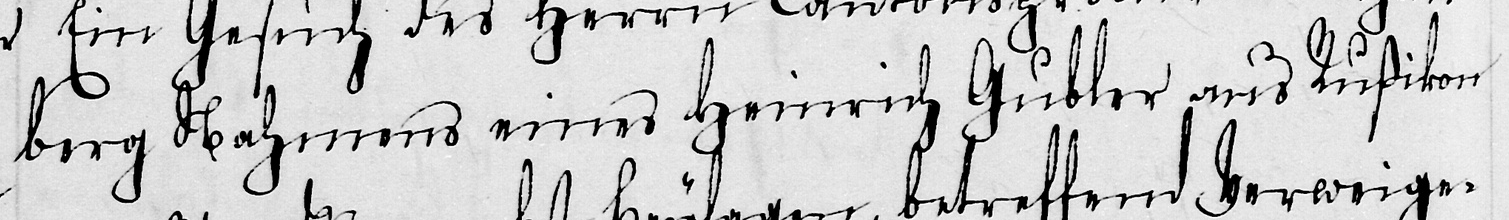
berg Nahmens eines Heinrich Gubler aus Rußikon
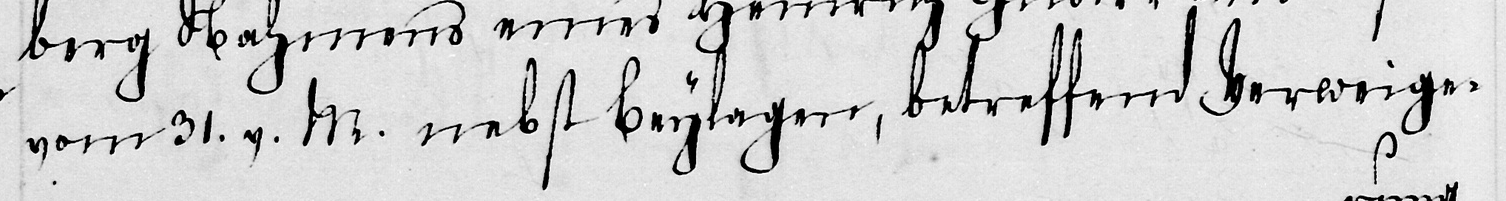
vom 31. v. M. nebst Beylagen, betreffend Verweige-
